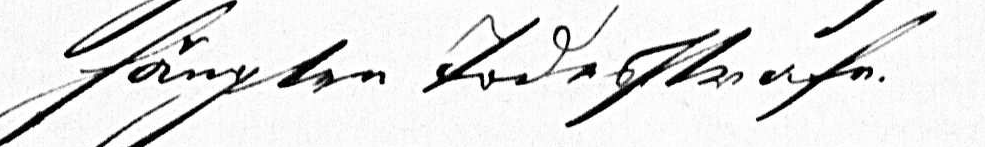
hängten Todesstrafe.
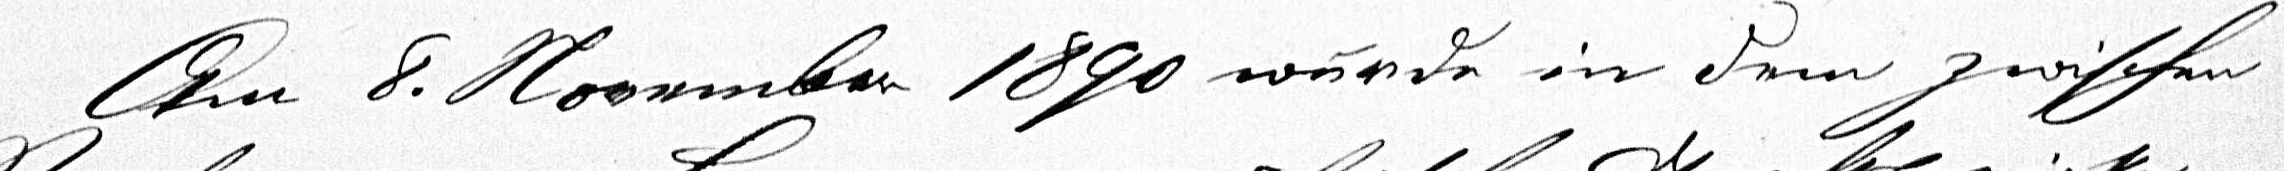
Am 8. November 1890 wurde in dem zwischen
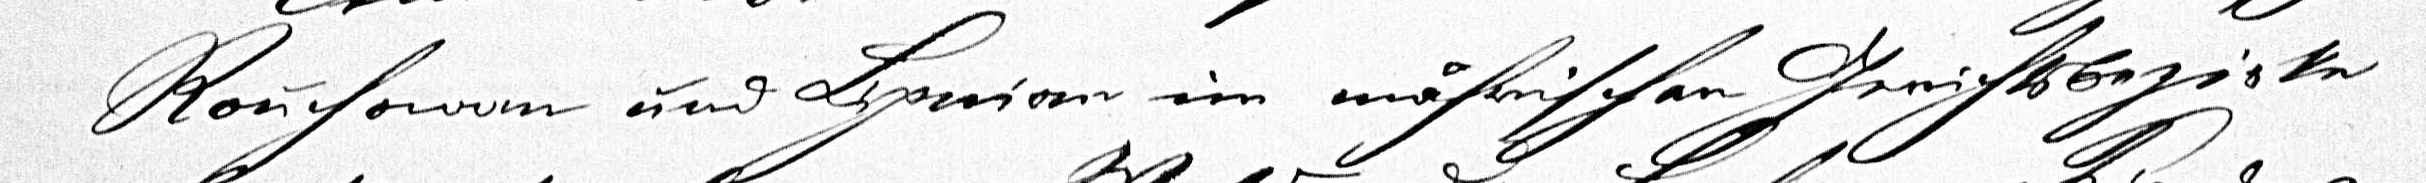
Rauchowom und in mährischen Gerichtsbezirke
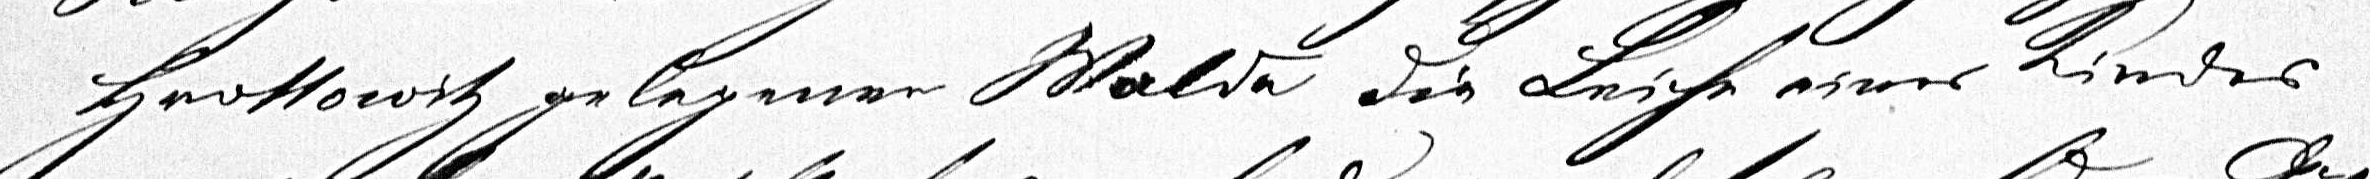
Hrossowitz gelegenen Walde die Leiche eines Kindes
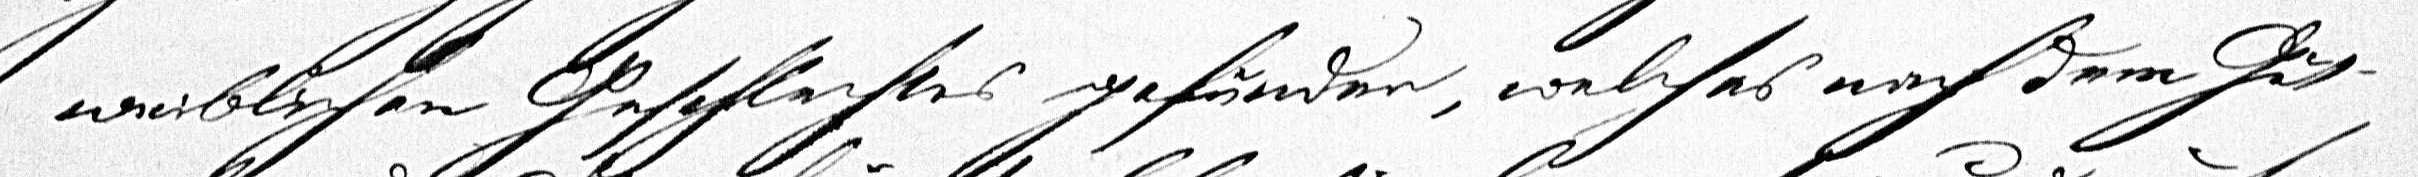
weiblichen Geschlechtes gefunden, welches nach dem Gu¬
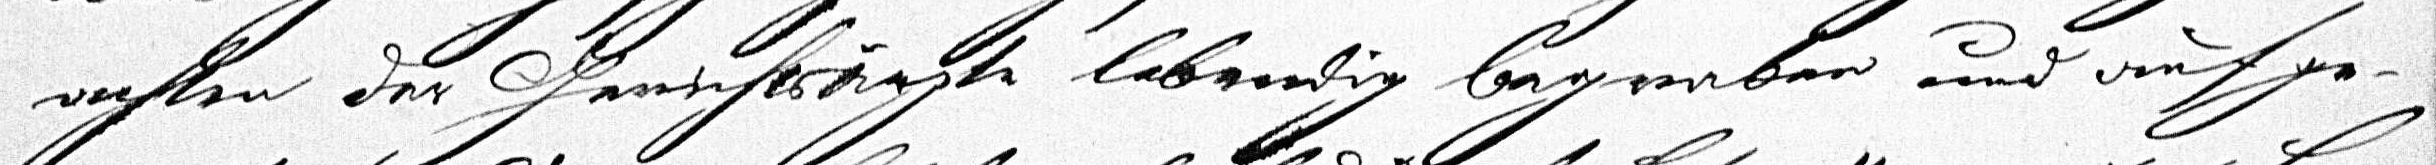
tachten der Gerichtsärzte lebendig begraben und auf ge¬
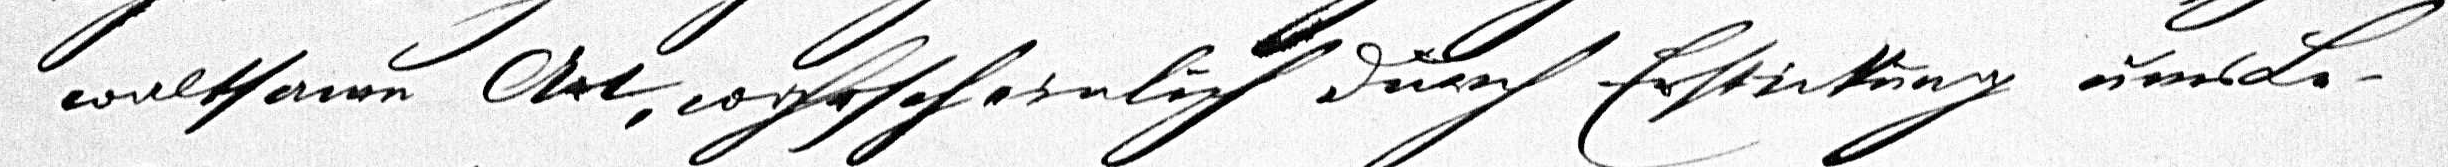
waltsame Art, wahrscheinlich durch Erstickung ums Le¬
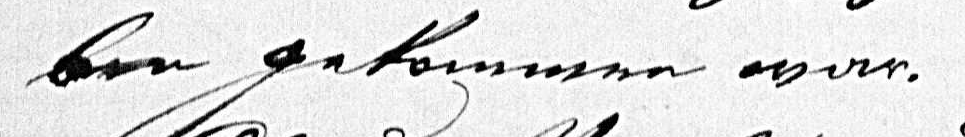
ben gekommen war.
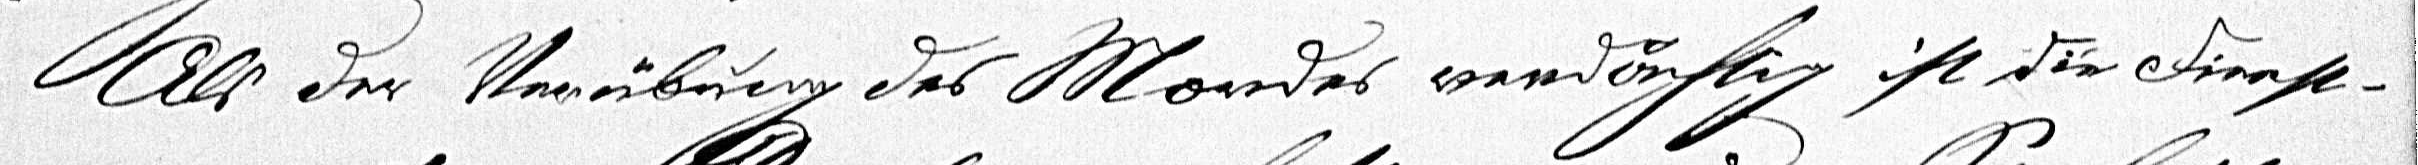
Als der Verübung des Mordes verdächtig ist die Firrst¬
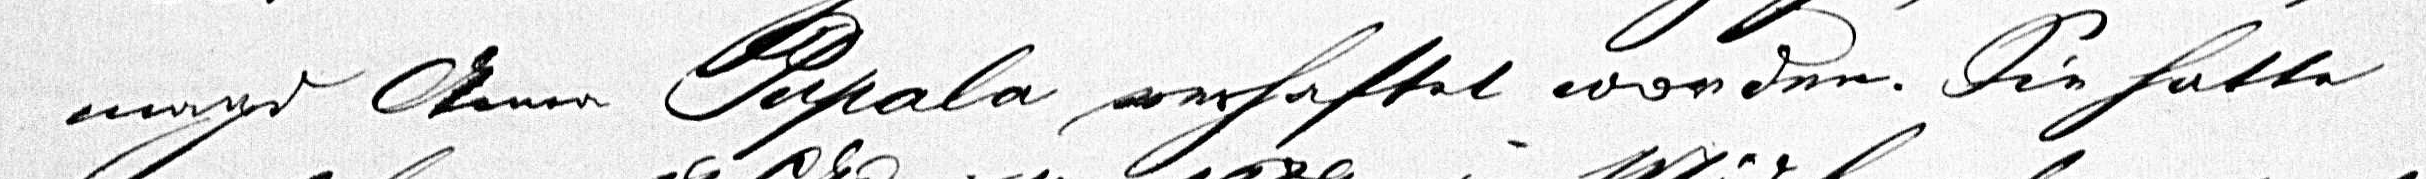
magd Anna Pupala verhaftet worden. Sie hatte
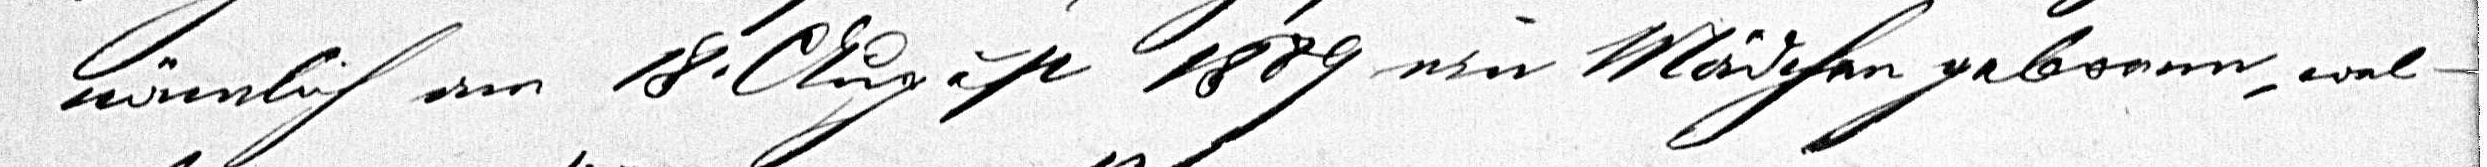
nämlich am 18. August 1889 ein Mädchen geboren, wel¬
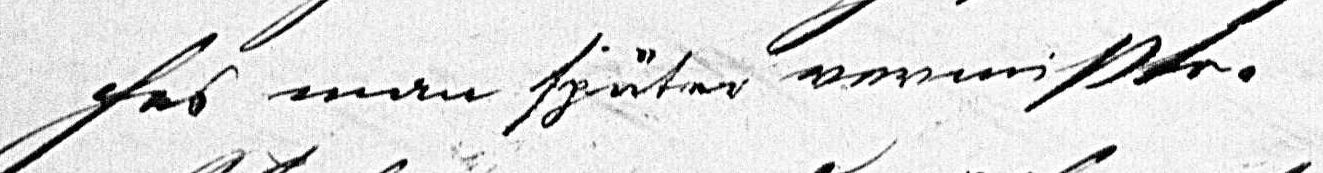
ches man später vermißten.
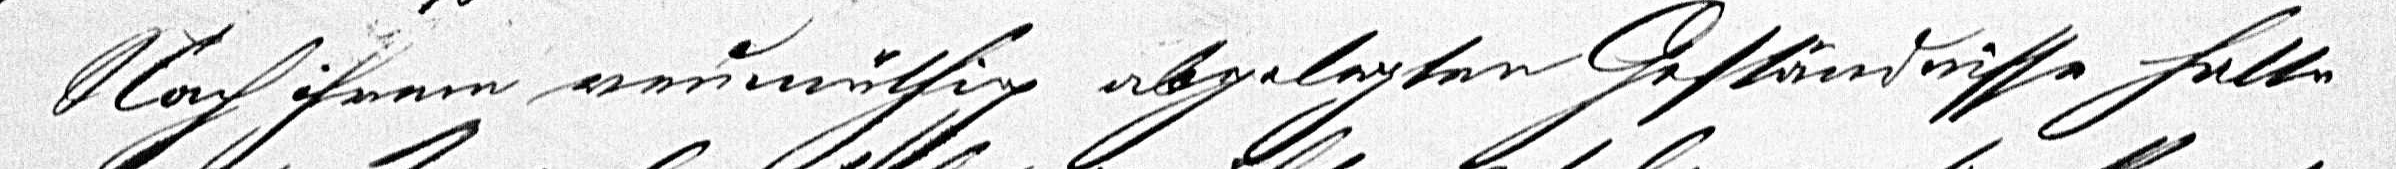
Nach ihren reumüthig abgelegten Geständnisse hatte
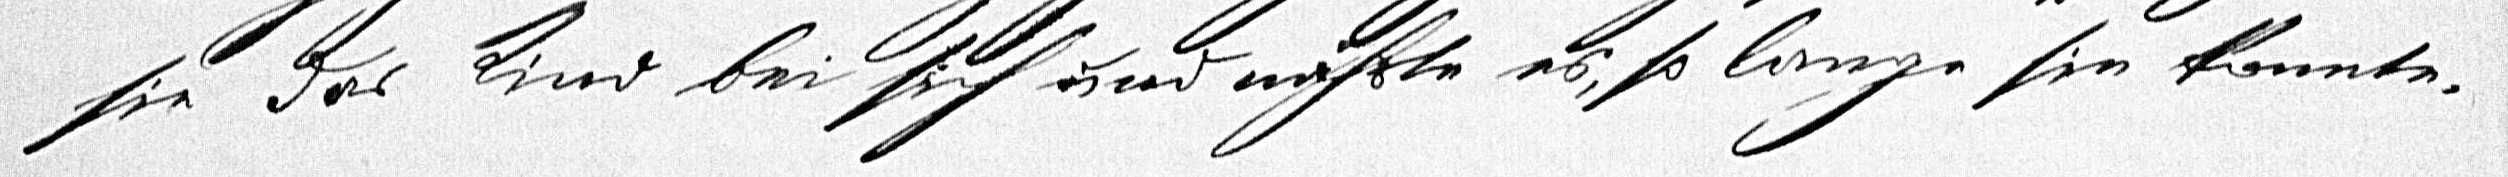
sie das Kind bei sich und nährte es, so lange sie konnte.
